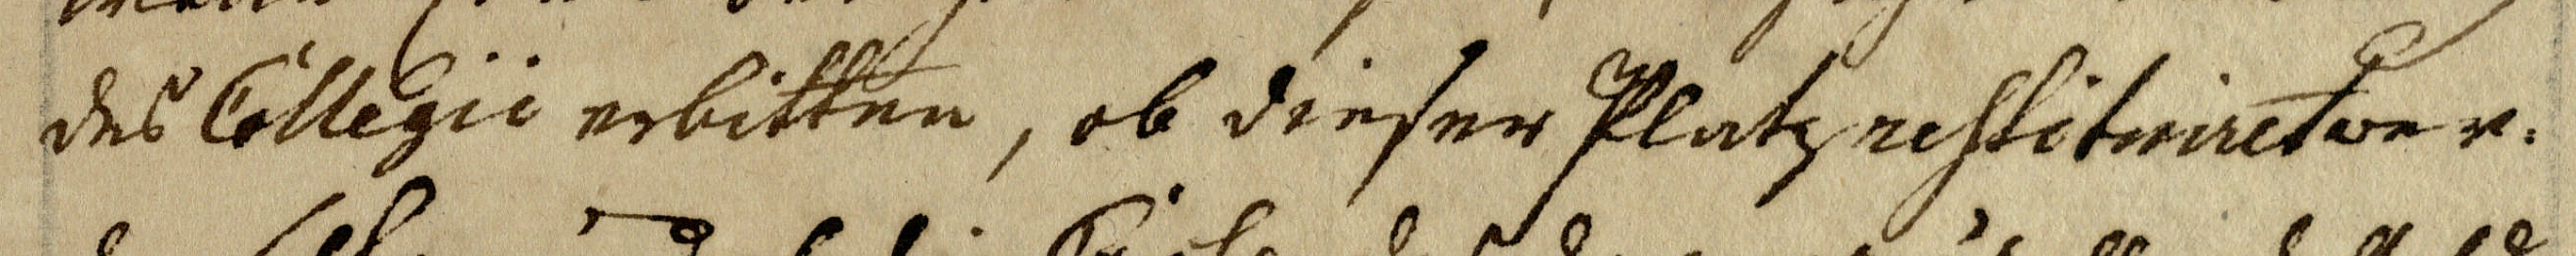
des Collegii erbitten, ob dieser Platz restituiret wer¬
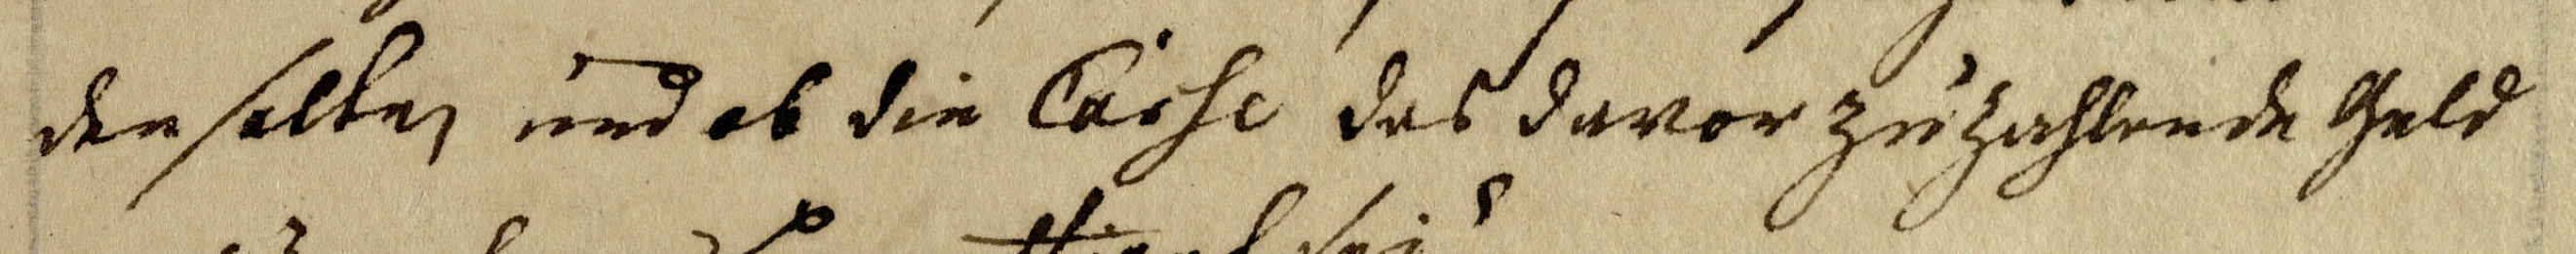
den solte, und ob die Casse das davor zuzahlende Geld
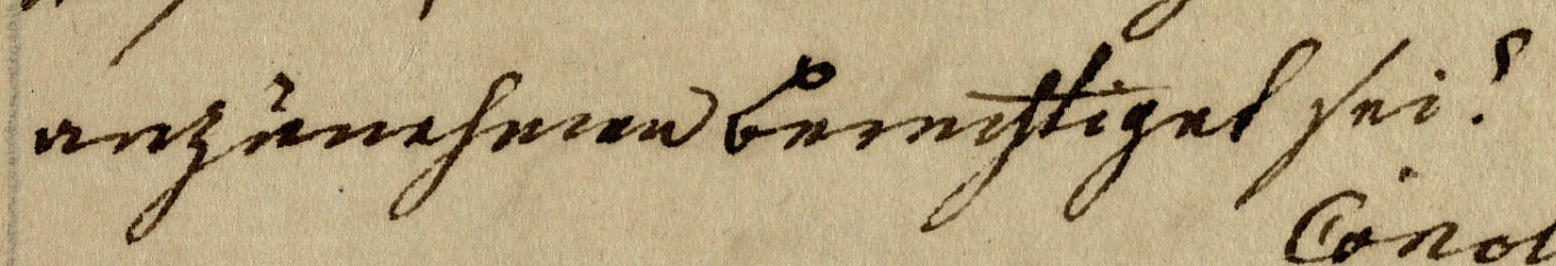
anzunehmen berechtiget sei?
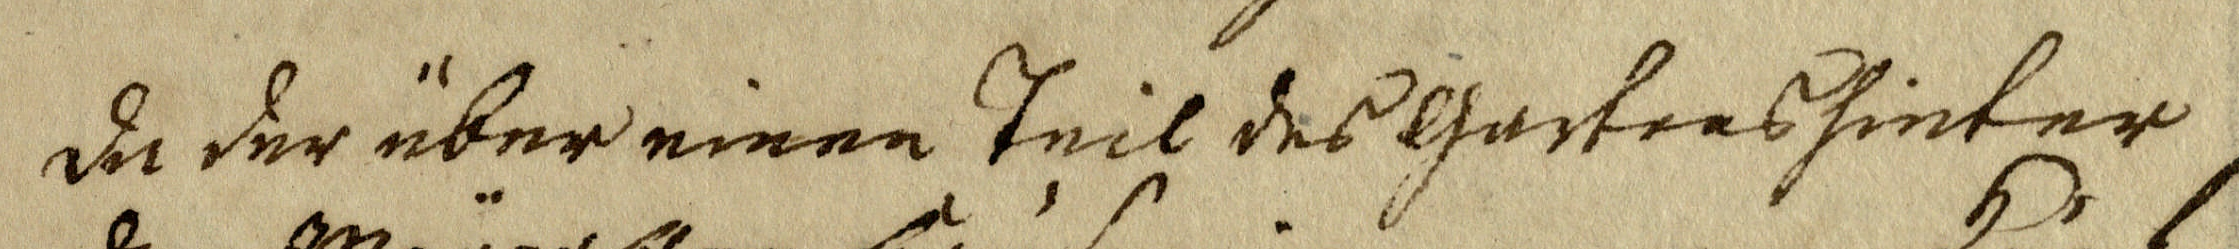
Da der über einen Theil des Gartens hinter
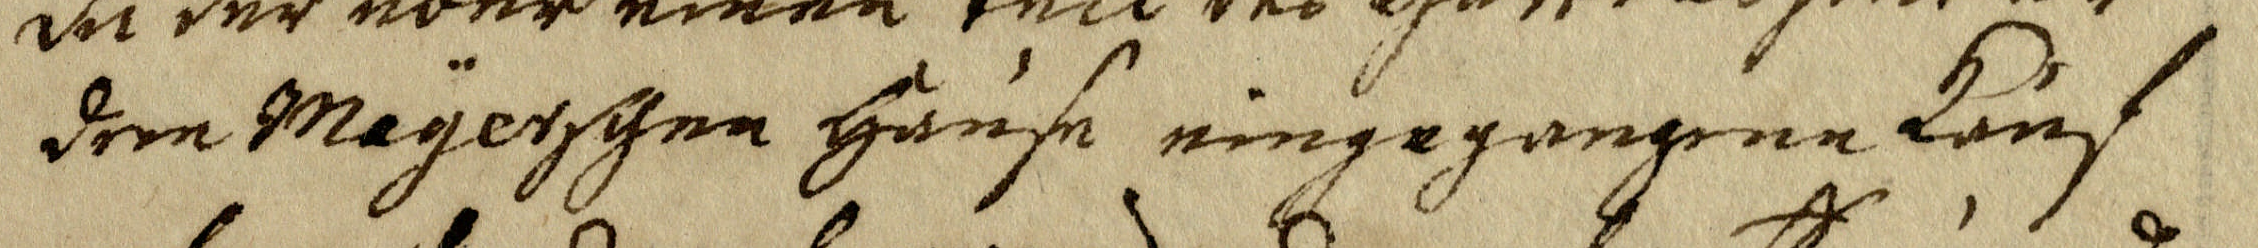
dem Maÿerschen Hause eingegangene Kauf
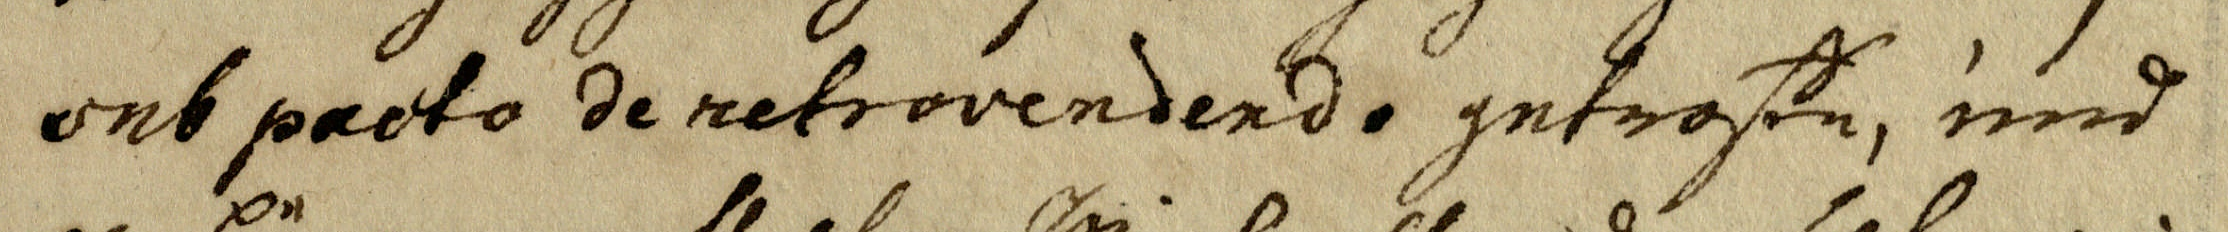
sub pacto de retrovendendo getroffen, und
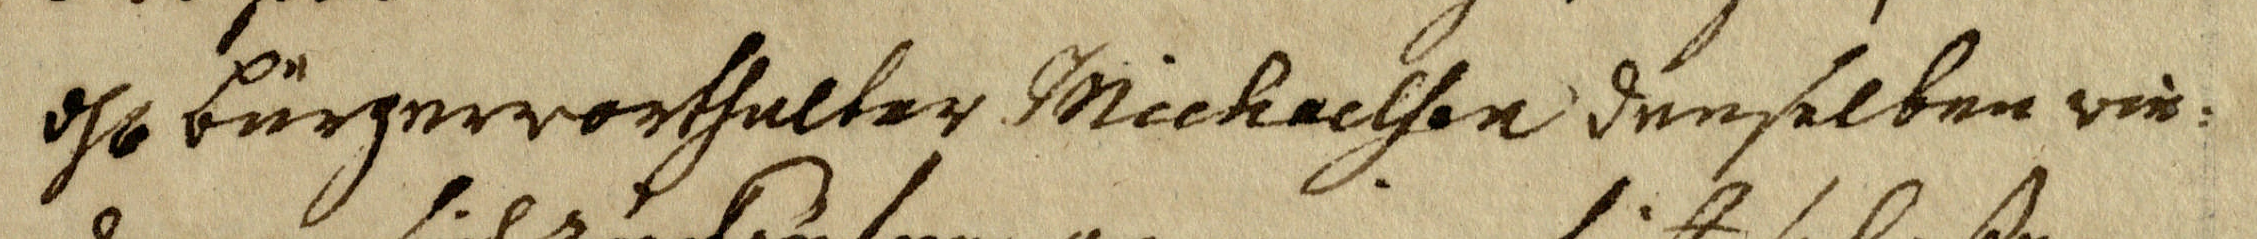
dh Bürgerworthalter Michaelsen denselben wie¬
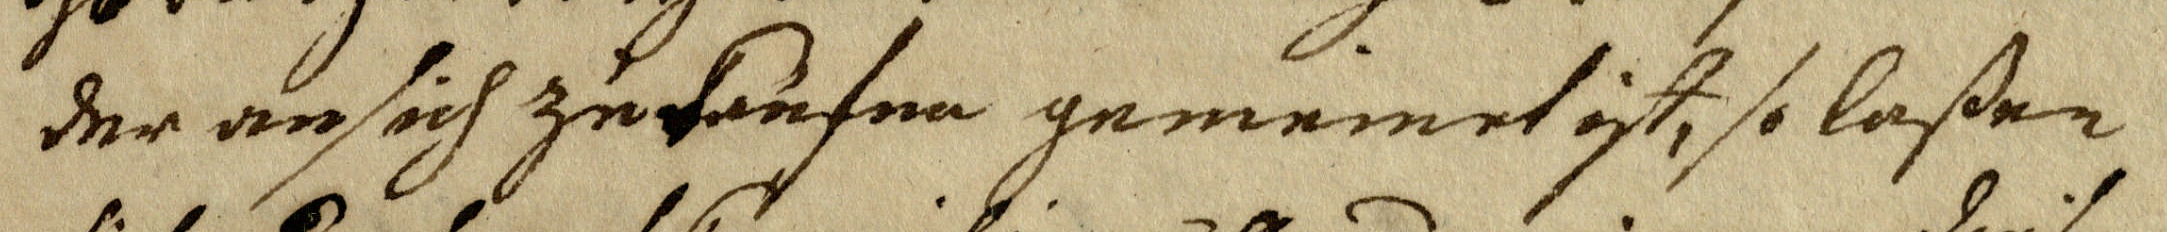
der an sich zu kauten gemeinet ist, so laßen
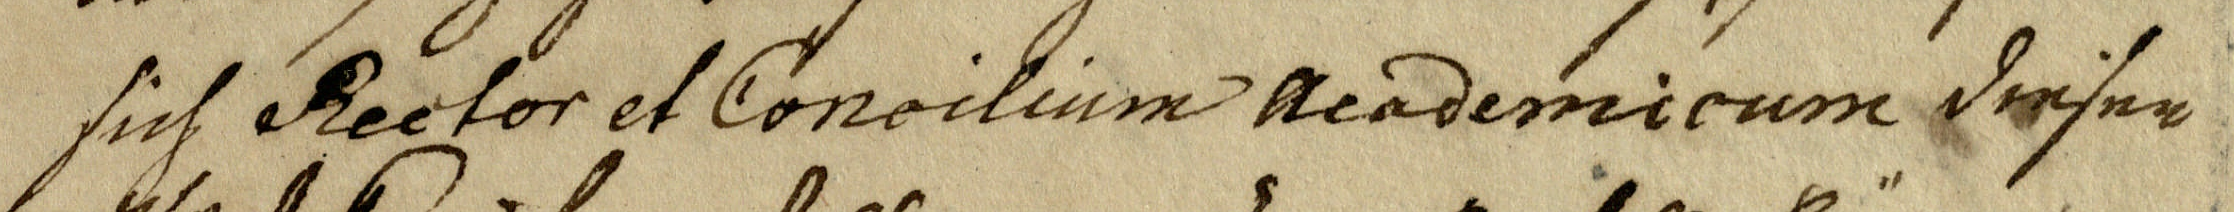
sich Rector et Concilium Academicum diesen
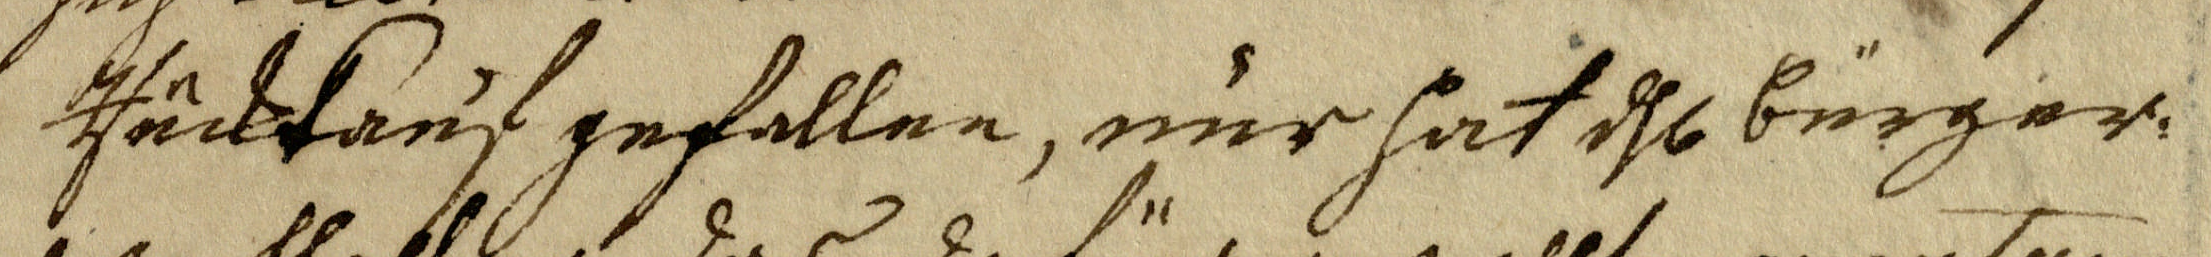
Rückkauf gefallen, nur hat dh. Bürger¬
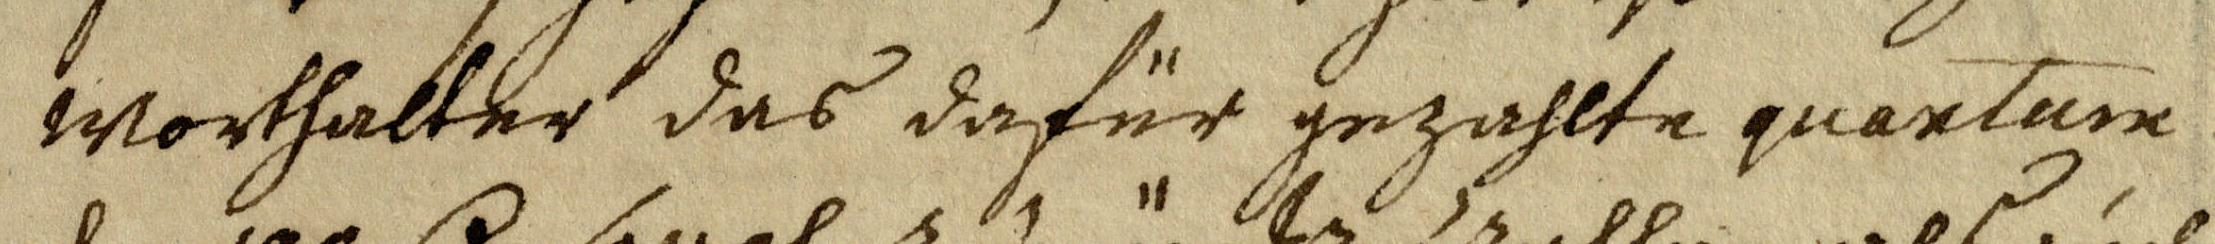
Worthalter das dafür gezahlte quantum
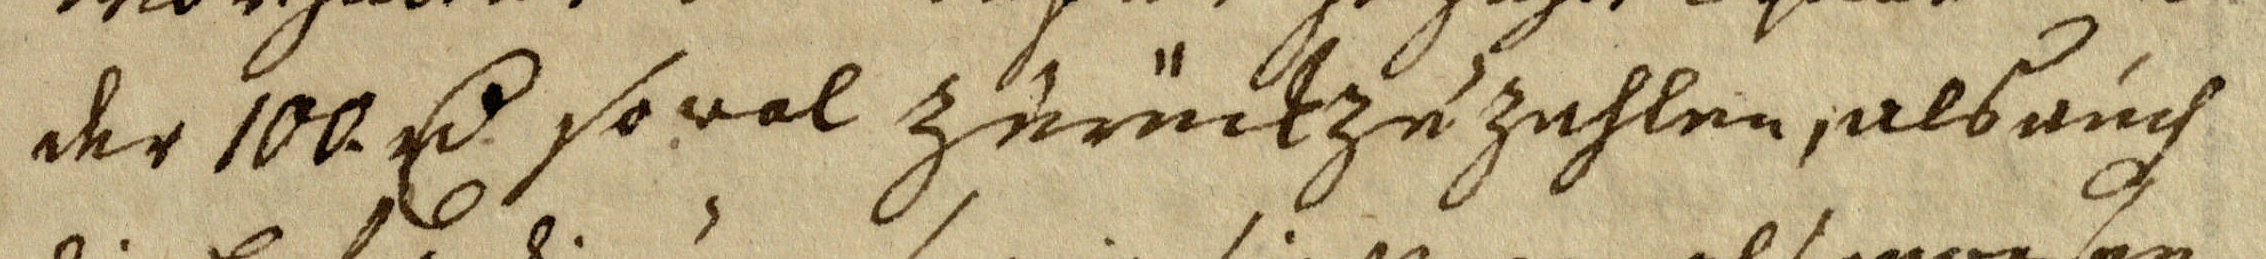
der 100 r. so wol zurückzuzahlen, als auch
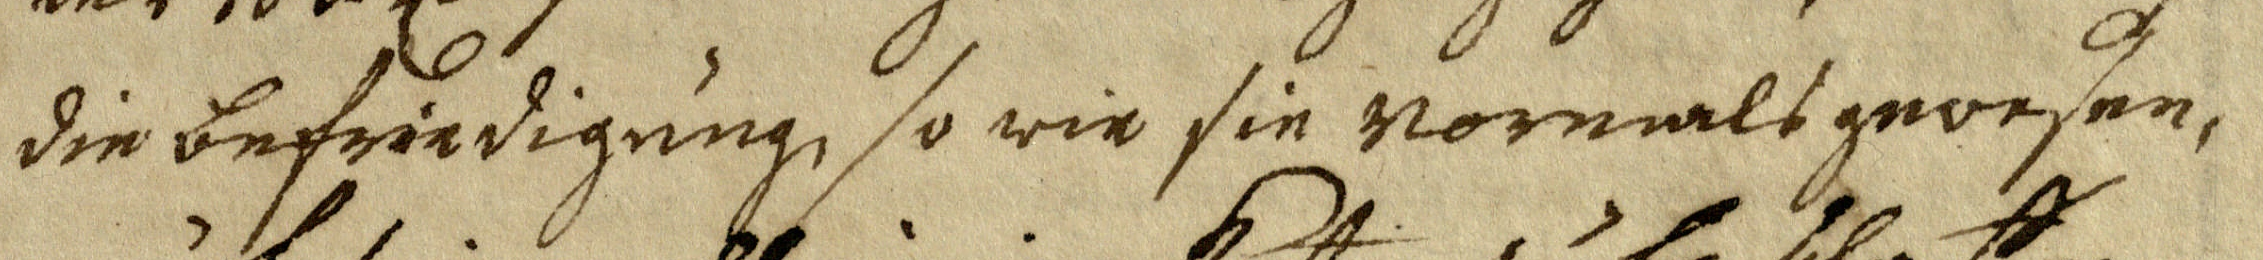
die Befriedigung, so wie sie vormals gewesen,
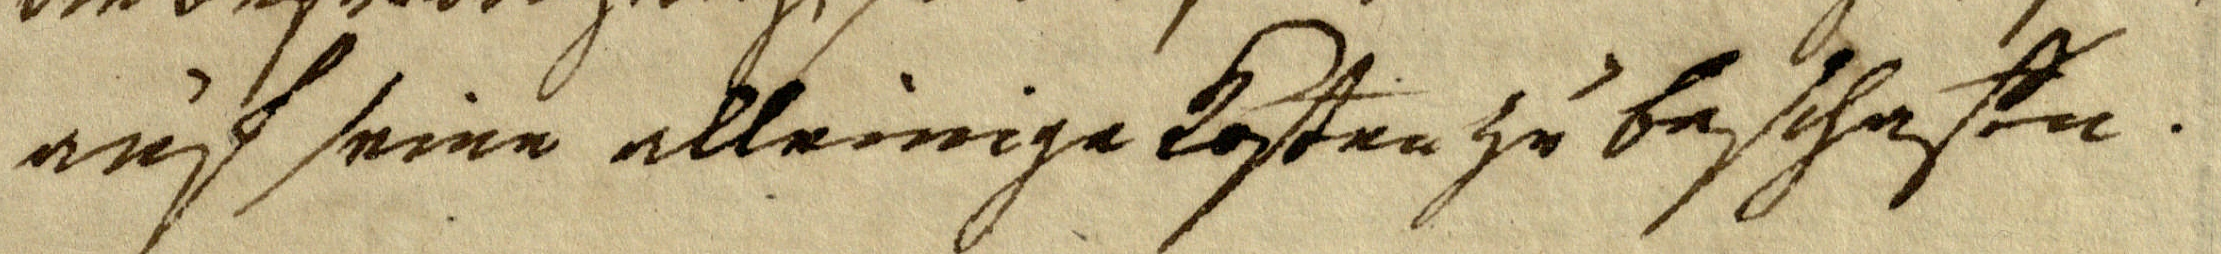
auf seine alleinige Kosten zu beschaffen.
